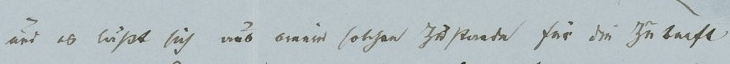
und es läßt sich aus einem solchen Zustande für die Zukunft
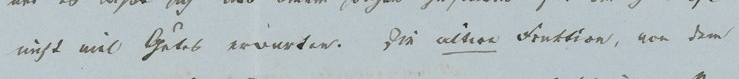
nicht viel Gutes erwarten. Die ältere Fraktion, von dem
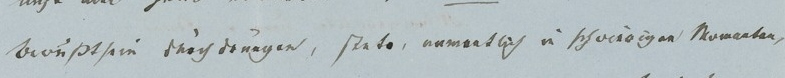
Bewußtsein durchdrungen, stets, namentlich in schwierigen Momenten,
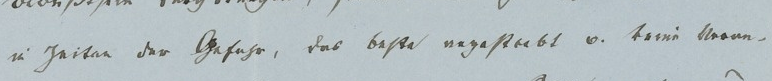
in Zeiten der Gefahr, das beste angestrebt u. keine Veran-
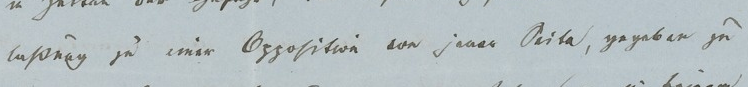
laßung zu einer Opposition von jener Seite, gegeben zu
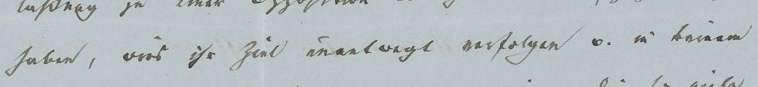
haben, wird ihr Ziel unentwegt verfolgen u. in keinem
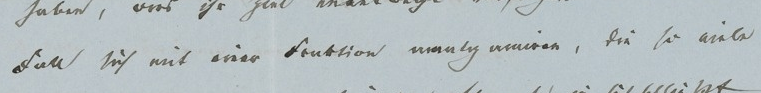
Fall sich mit einer Fraktion amalgamiren, die so viele
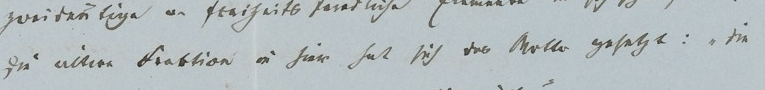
Die ältere Fraktion in hier hat sich das Motto gesetzt: «Die
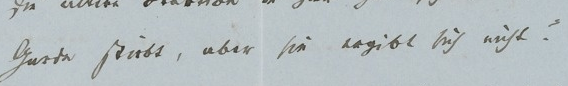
Garde stirbt, aber sie ergibt sich nicht.»
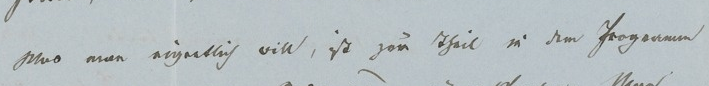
Was man eigentlich will, ist zum Theil in dem Programm
